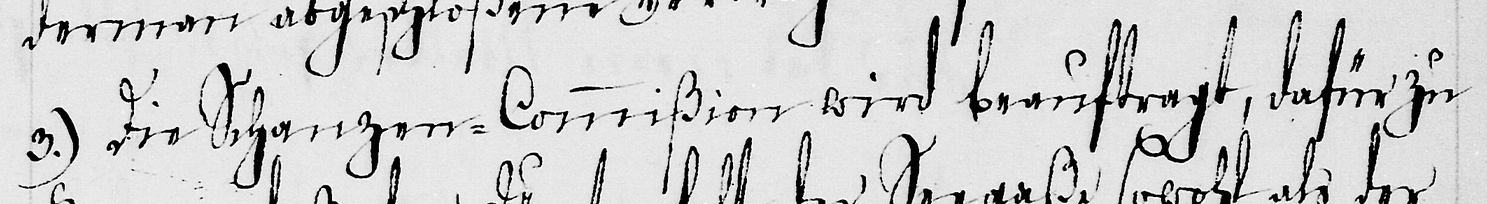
3.) Die Schanzen-Commißion wird beauftragt, dafür zu
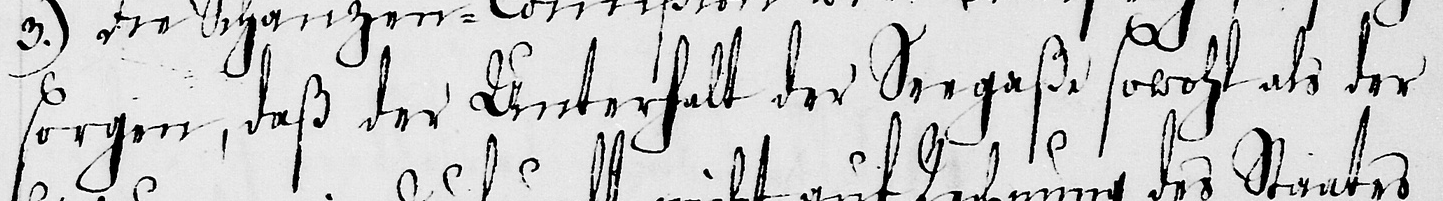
sorgen, daß der Unterhalt der Seegaße sowohl als der
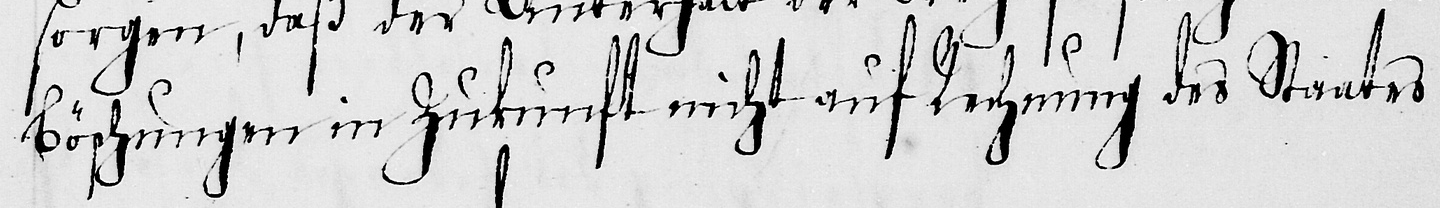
Böschung in Zukunft nicht auf Rechnung des Staates
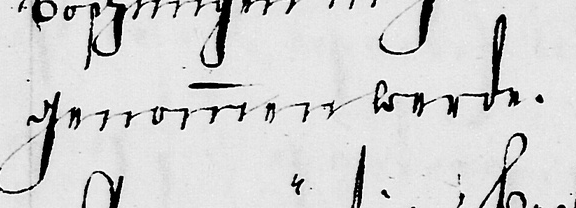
genommen werde.
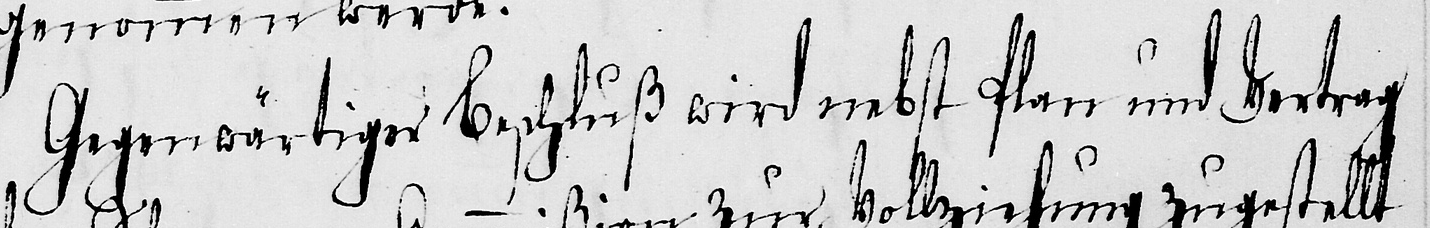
Gegenwärtiger Beschluß wird nebst Plan und Vertrag
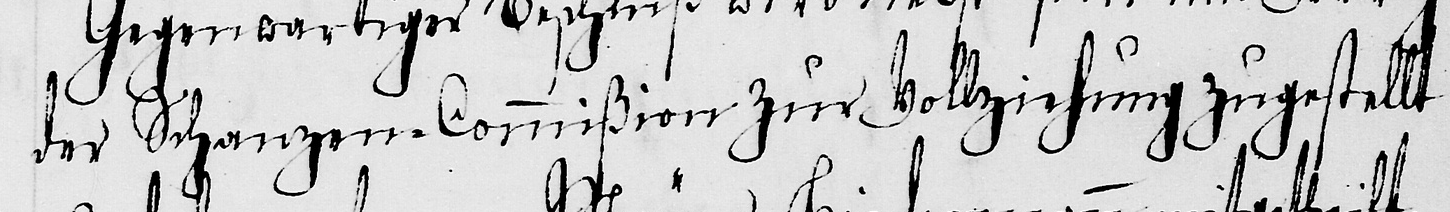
der Schanzen-Commißion zur Vollziehung zugestellt
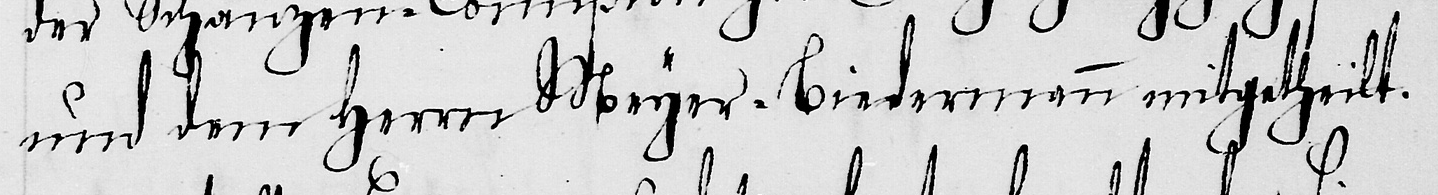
und dem Herrn Meyer-Biedermann mitgetheilt.
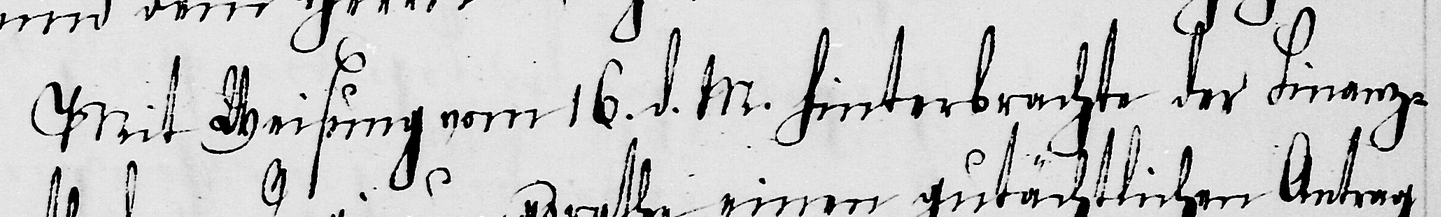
Mit Weisung vom 16. d. M. hinterbrachte der Finanz¬
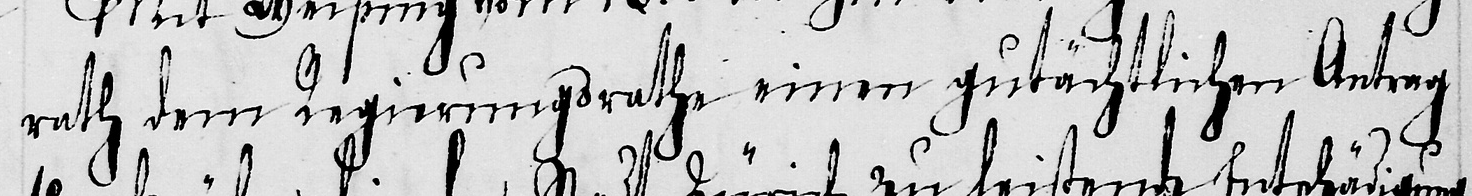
rath dem Regierungsrathe einen gutächtlichen Antrag
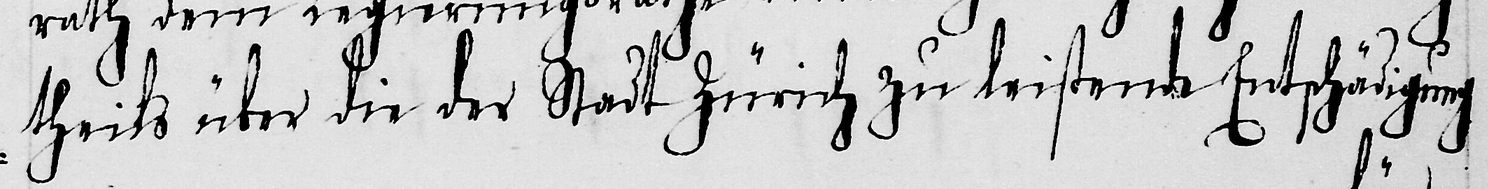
theils über die der Stadt Zürich zu leistende Entschädigung
